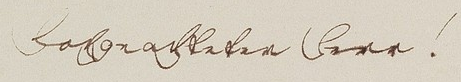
Hochgeachteter Herr!
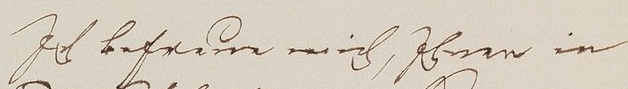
Ich befreue mich, Ihnen in
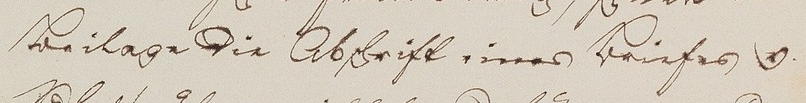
Beilage die Abschrift eines Briefes v.
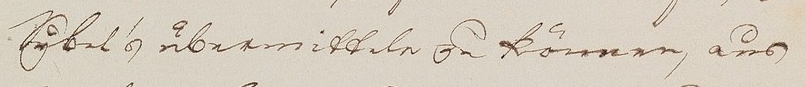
Sybel's übermitteln zu können, aus
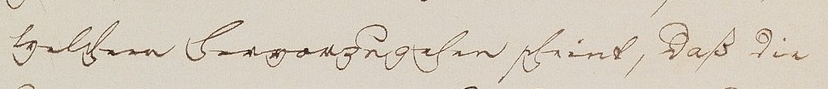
welchem hervorzugehen scheint, daß die
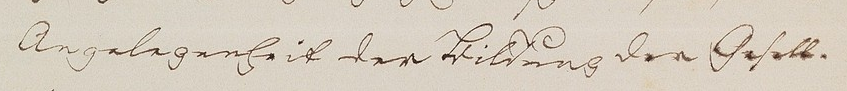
Angelegenheit der Bildung der Gesell-
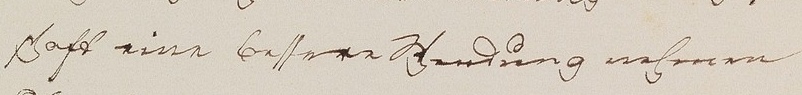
schaft eine bessere Wendung nehmen
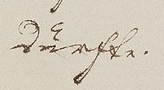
dürfte.
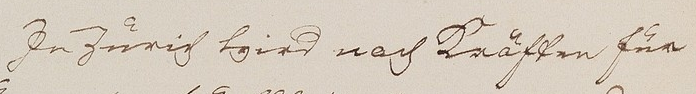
In Zürich wird nach Kräften für
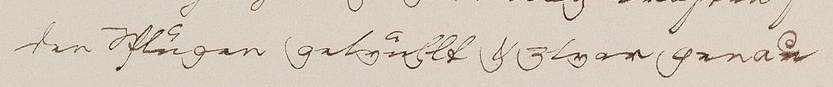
den Splügen gewühlt & zwar genau
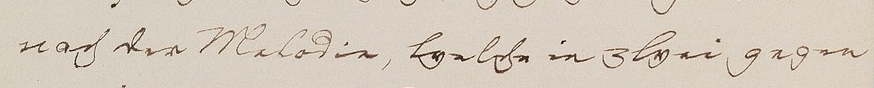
nach der Melodie, welche in zwei gegen
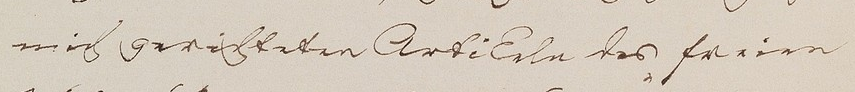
mich gerichteten Artikeln des «freien
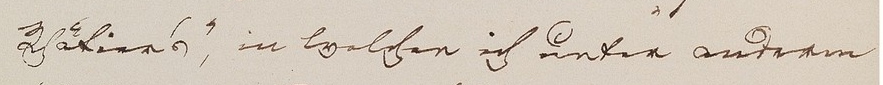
Rhätier's», in welchen ich unter anderm
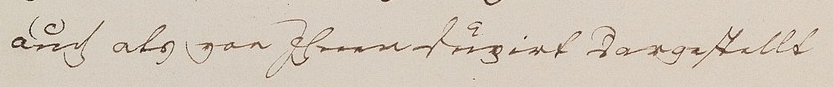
auch als von Ihnen düpirt dargestellt
